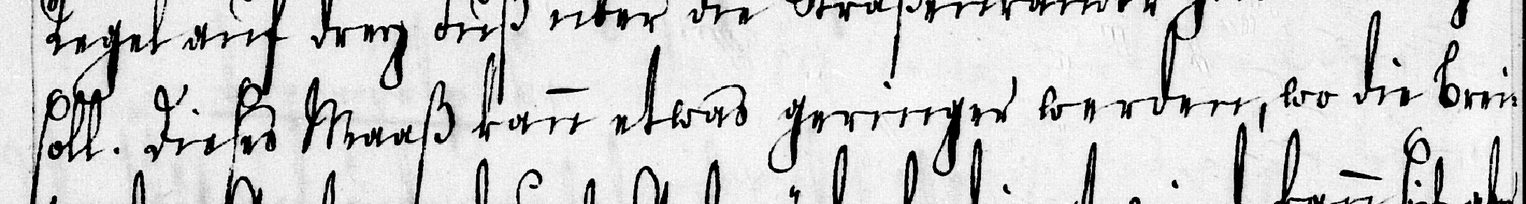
soll. Dieses Maaß kann etwas geringer werden, wo die Brei¬
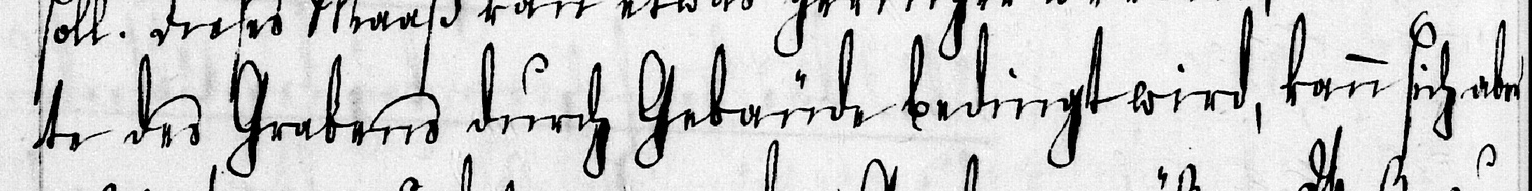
te des Grabens durch Gebäude bedingt wird, kann sich
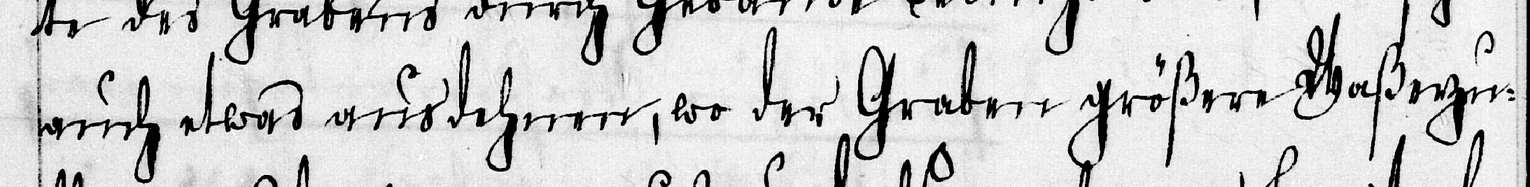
auch etwas ausdehnen, wo der Graben größere Waßerzu¬
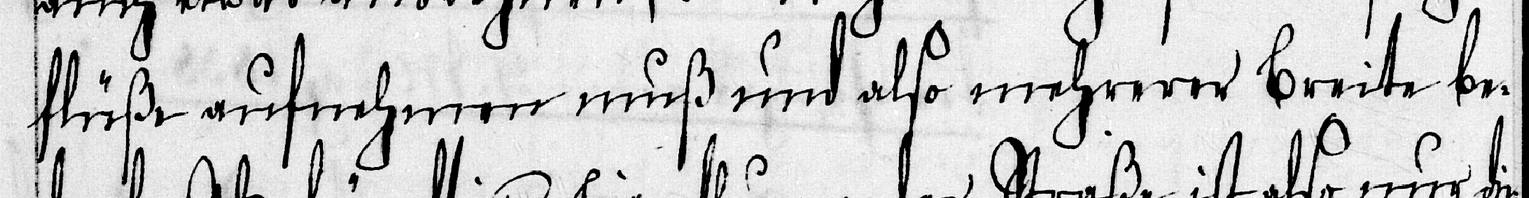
flüße aufnehmen muß und also mehrerer Breite be¬
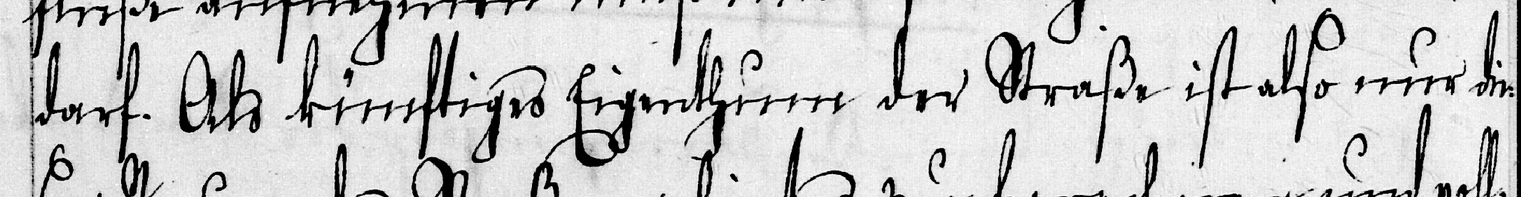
darf. Als künftiges Eigenthum der Straße ist also nur di¬
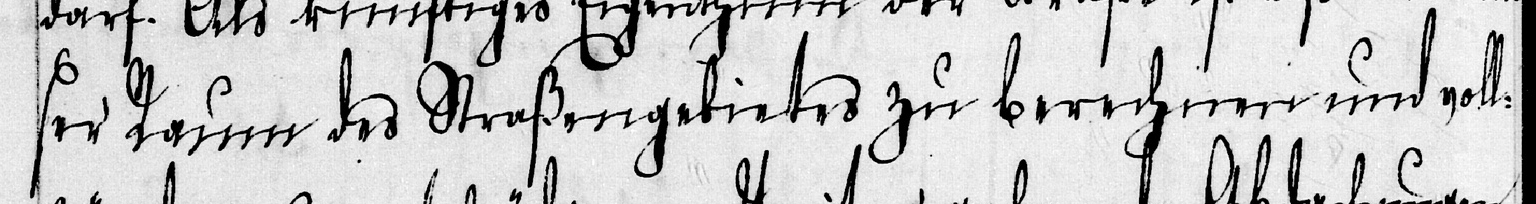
eser Raum des Straßengebietes zu berechnen und vol¬
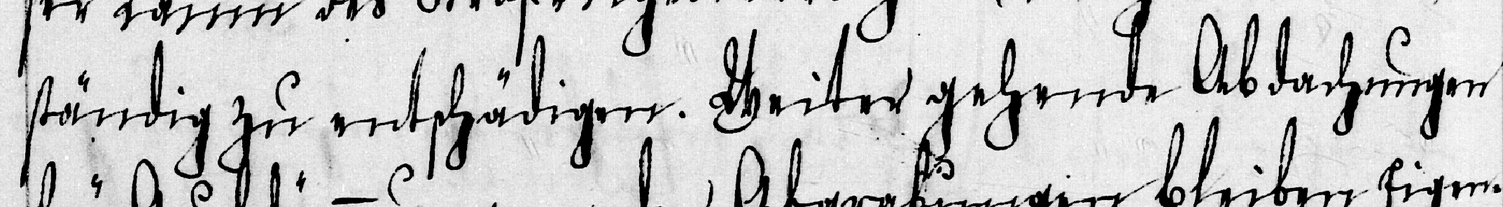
ständig zu entschädigen. Weiter gehende Abdachungen
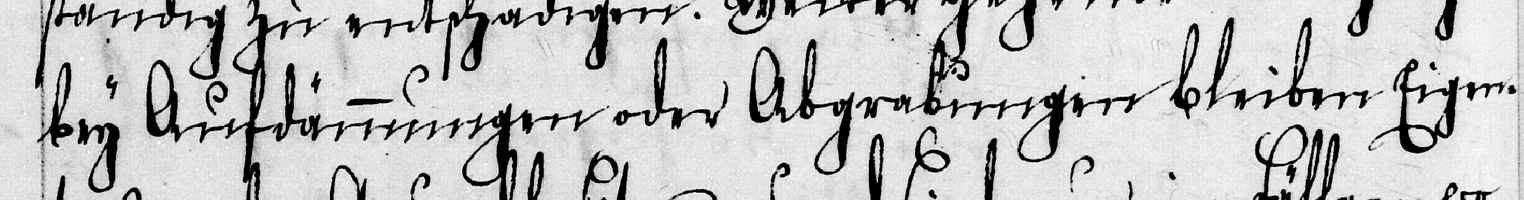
bey Aufdämmungen oder Abgrabungen bleiben Eigen¬
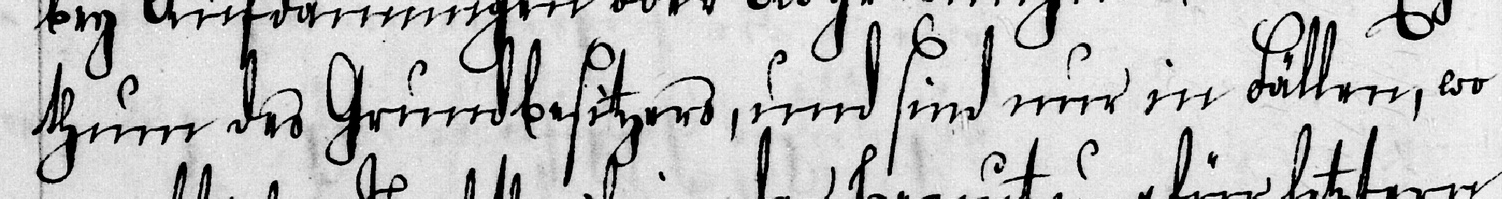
thum des Grundbesitzers, und sind nur in Fällen, wo
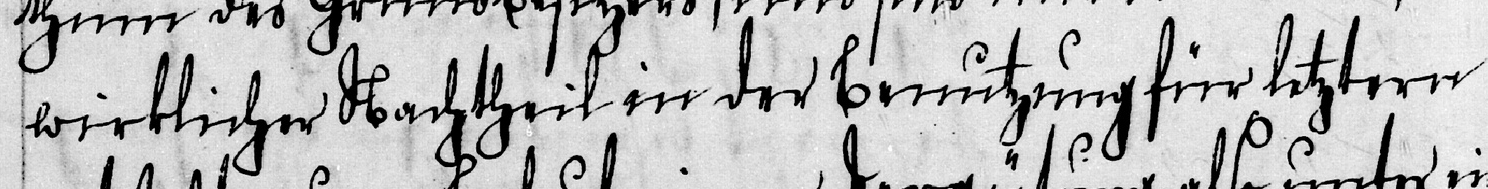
wirklicher Nachtheil in der Benutzung für letztern
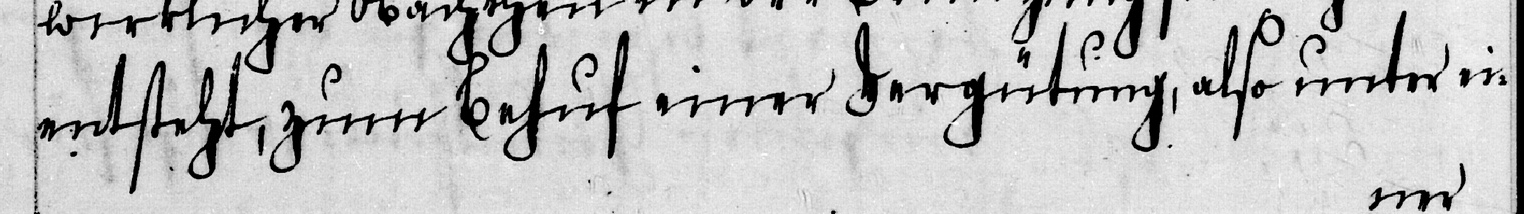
entsteht, zum Behuf einer Vergütung, also unter ei-
